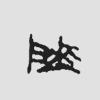陵
